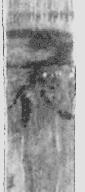六
